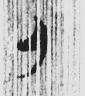人
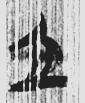立
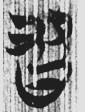○（友）
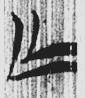亡（無）
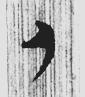人
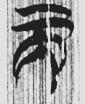而
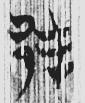邦
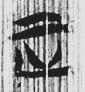正（政）
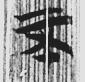不
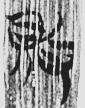敗
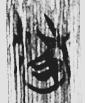○（僕）
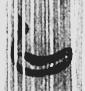㠯
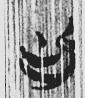此
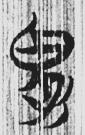{胃刀}（謂）
